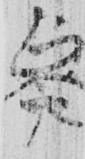矣
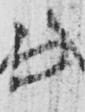公
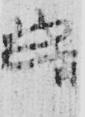弗
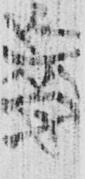○（圖）
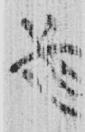必
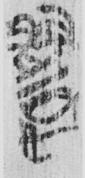○（害）
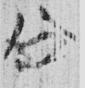公
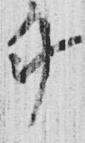身
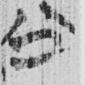公
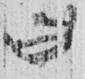曰
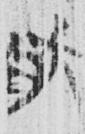○（然）
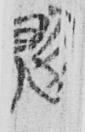則
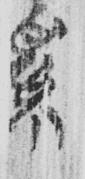奚
